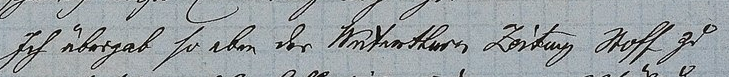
Ich übergab so eben der Winterthurer Zeitung Stoff zu
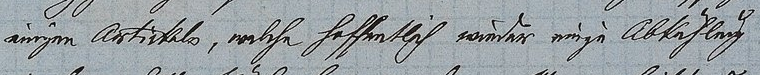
einigen Artikeln, welche hoffentlich wieder einige Abkühlung
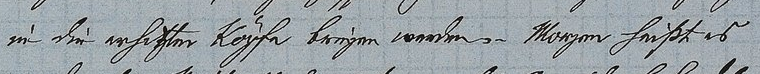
in die erhitzten Köpfe bringen werden. – Morgen heißt es
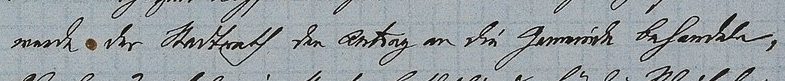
werde der Stadtrath den Antrag an die Gemeinde behandeln,
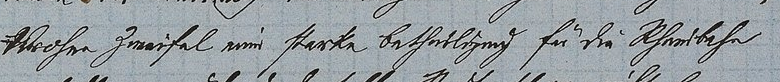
ohne Zweifel eine starke Betheiligung für die Rheinbahn
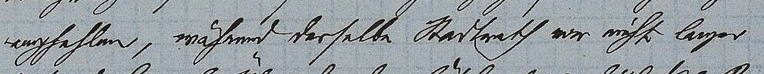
empfehlen, während derselbe Stadtrath vor nicht langer
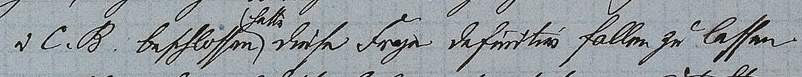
& C.B. beschlossen hatte diese Frage definitiv fallen zu lassen.
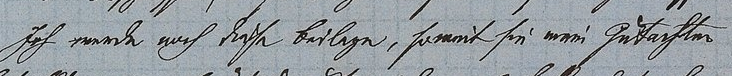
Ich werde noch diese Beilage, soweit sie mein Gutachten
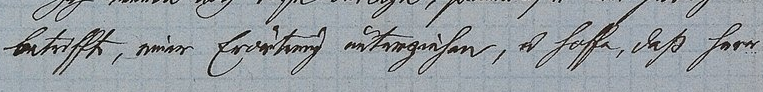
betrifft, einer Erörterung unterziehen, & hoffe, daß Herr
